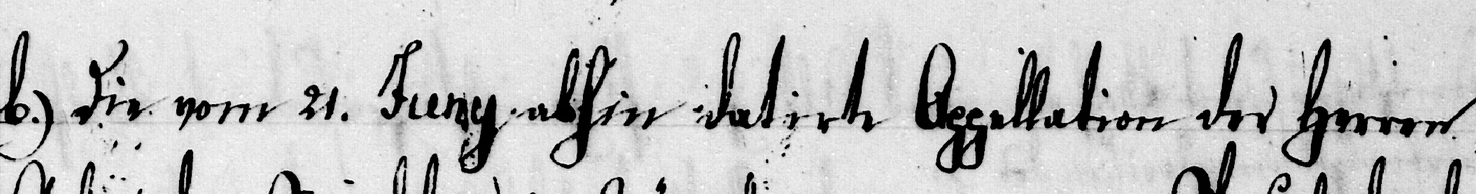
b.) Die vom 21. Juny abhin datirte Appellation der Herren
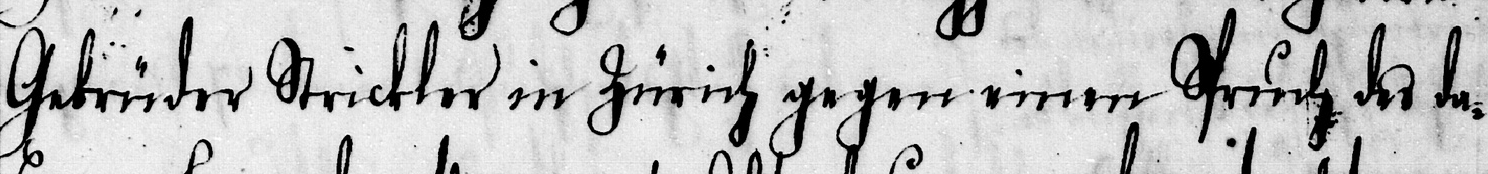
Gebrüder Strickler in Zürich gegen einen Spruch des da¬
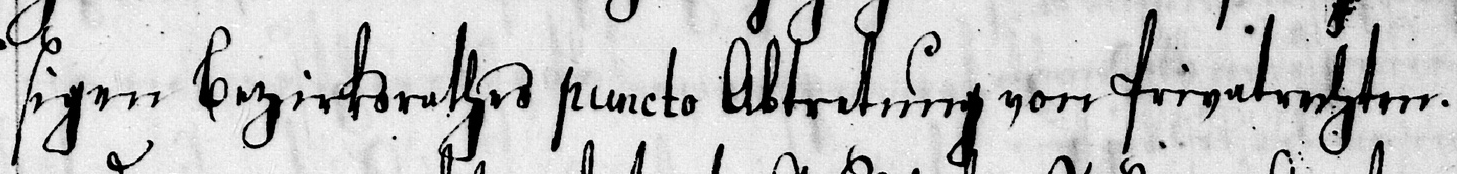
sigen Bezirksrathes puncto Abtretung von Privatrechten.
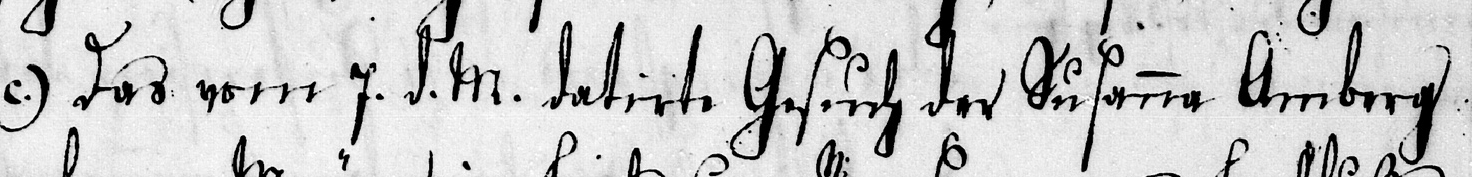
c.) Das vom 7. d. M. datirte Gesuch der Susanna Amberg
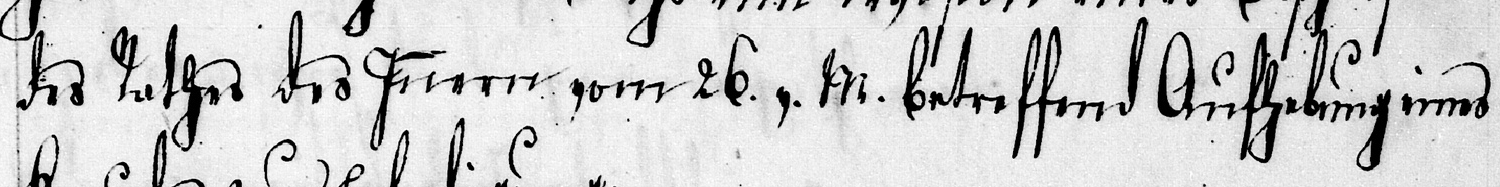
des Rathes des Innern vom 26. v. M. betreffend Aufhebung eines
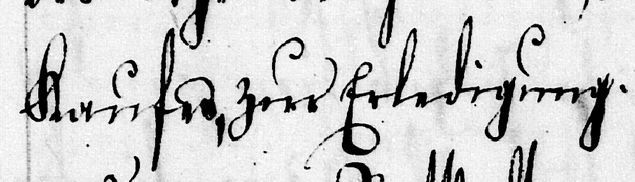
Kaufes, zur Erledigung.
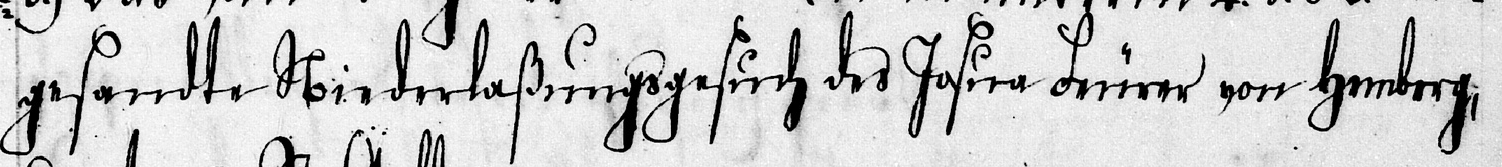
gesandte Niederlaßungsgesuch des Josua Feurer von Hemberg,
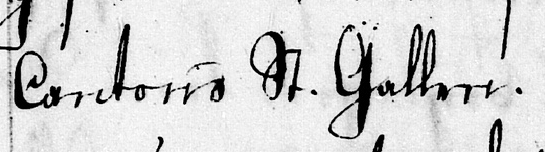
Cantons St. Gallen.
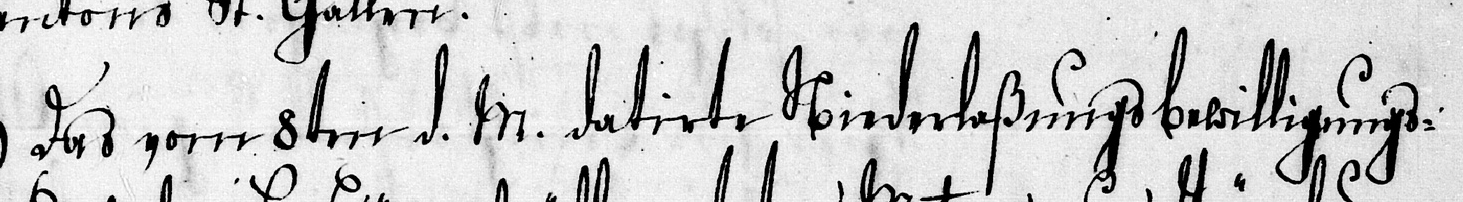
Das vom 8ten d. M. datirte Niederlaßungsbewilligungs¬
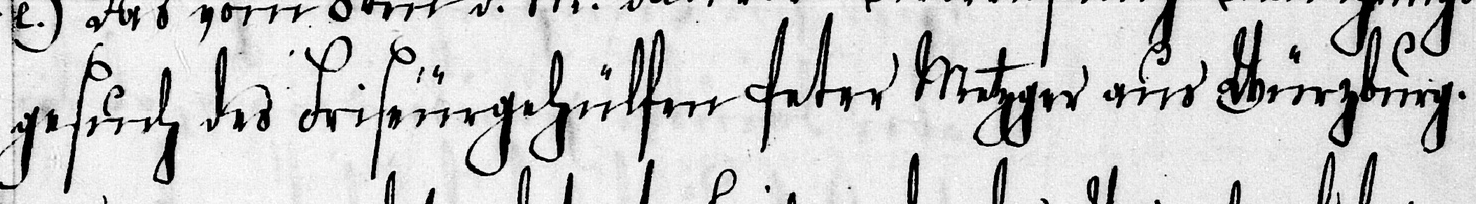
gesuch des Friseurgehülfen Peter Metzger aus Würzburg.
